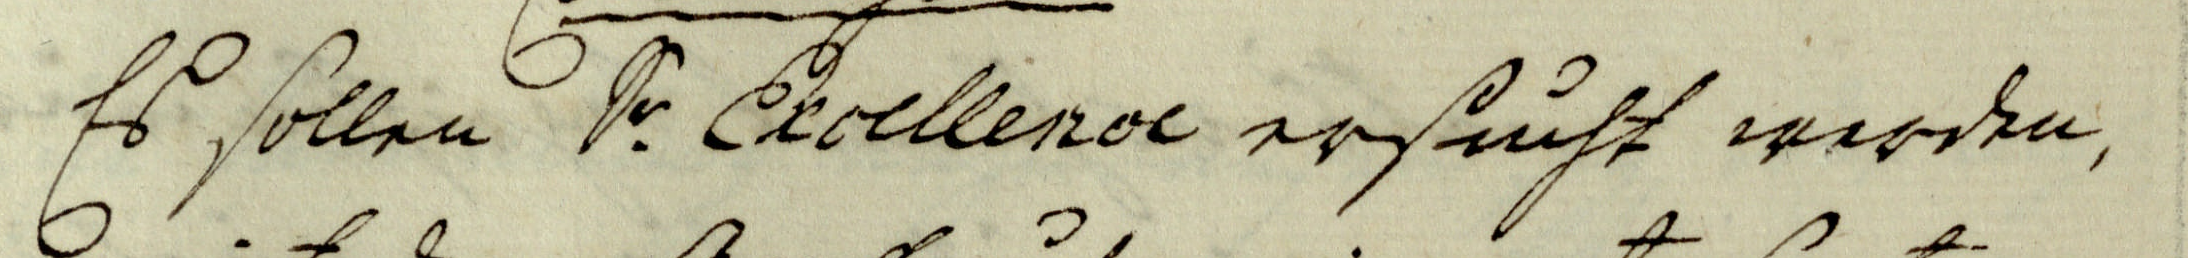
Es sollen Sr Excellence ersucht werden,
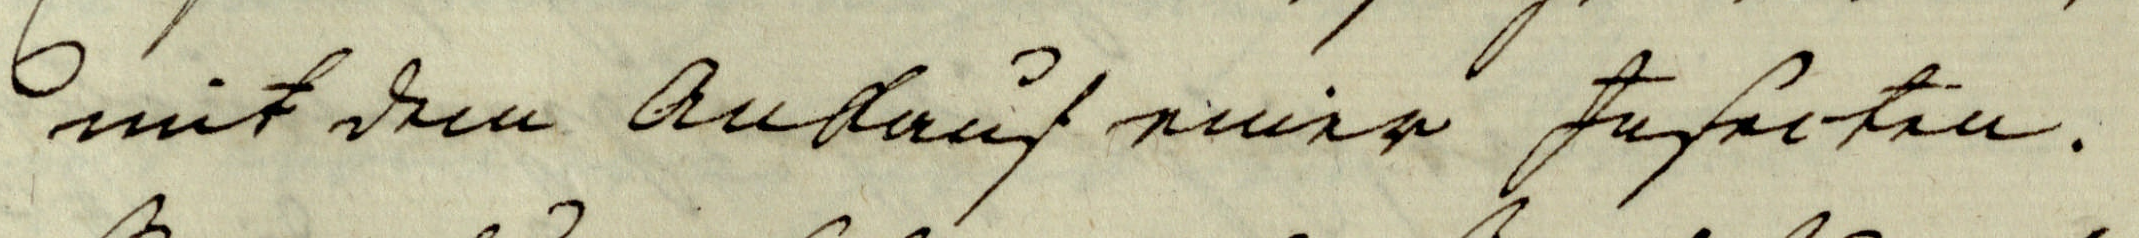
mit dem Ankauf einer Insecten¬
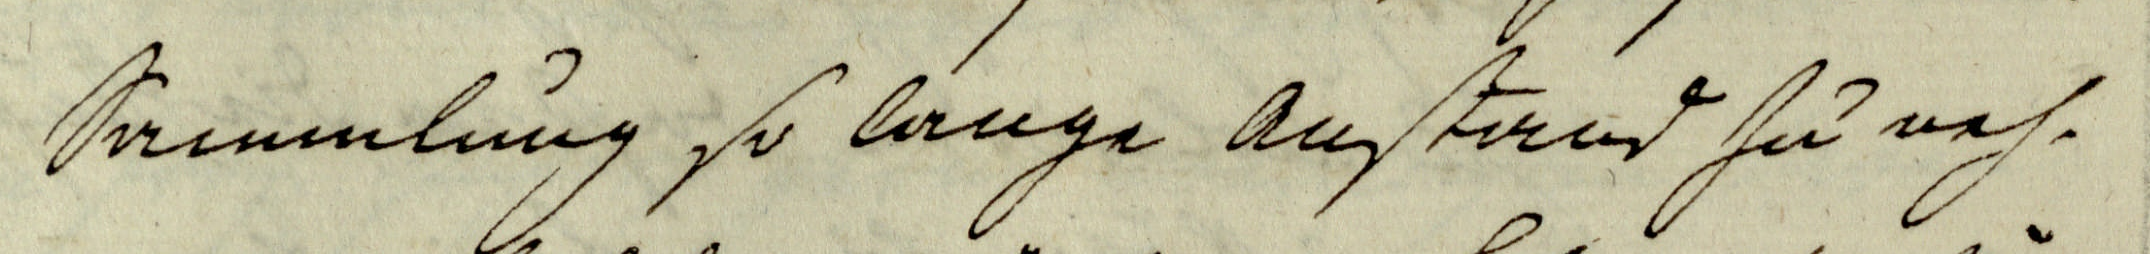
Sammlung so lange Anstand zu neh¬
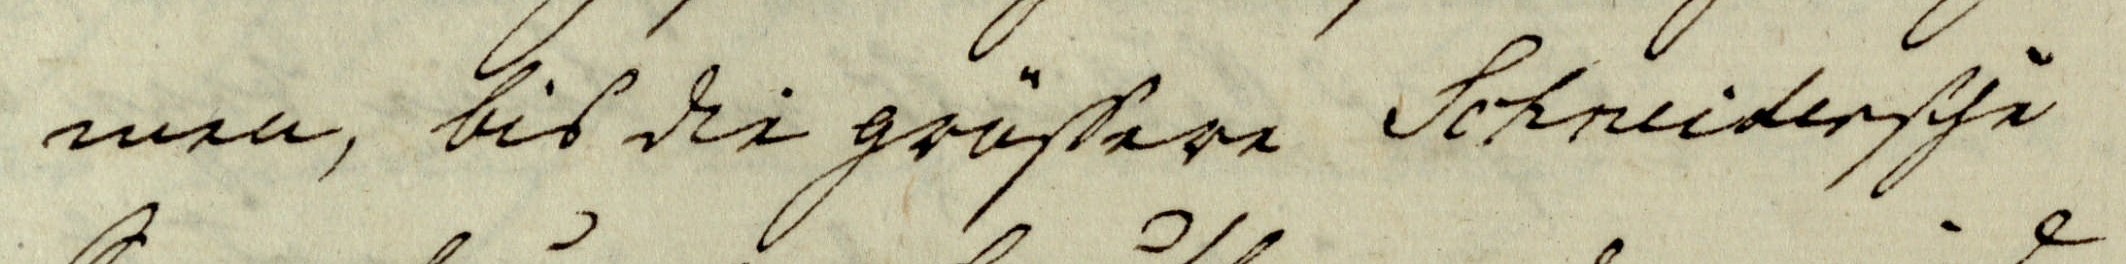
men, bis die grössere Schneidersche
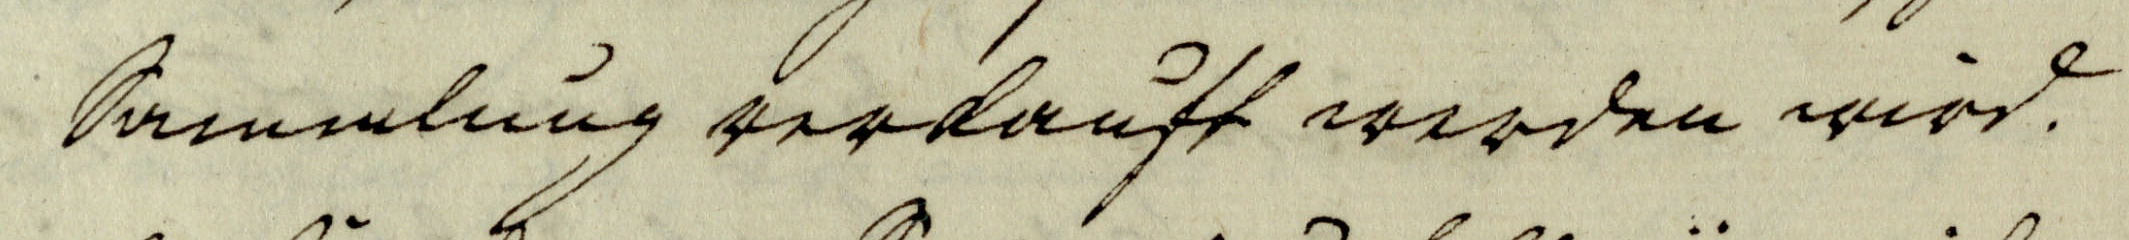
Sammlung verkauft werden wird.
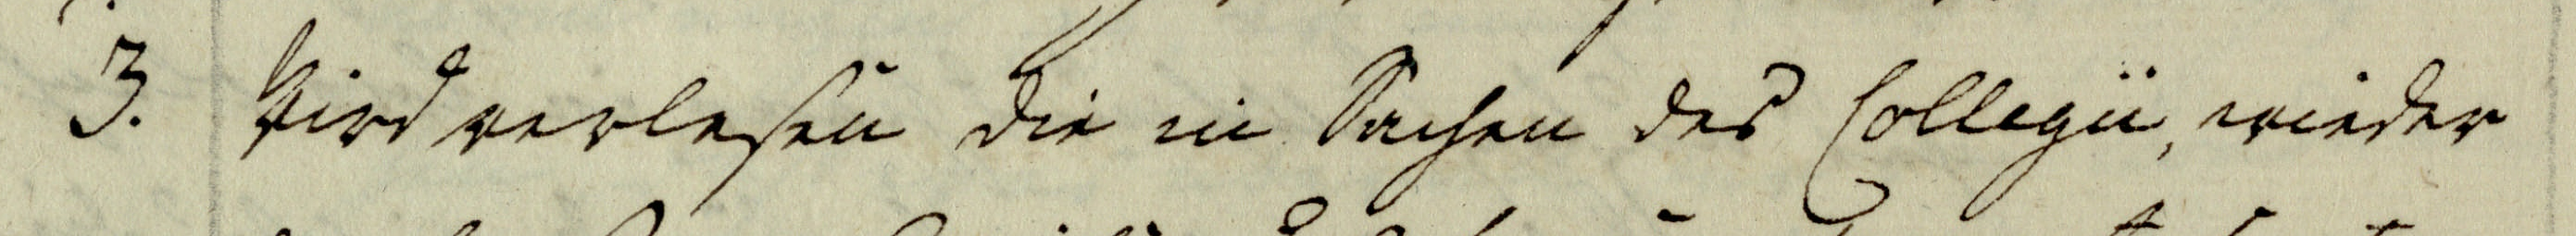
3. Wird verlesen die in Sachen des Collegii, wieder
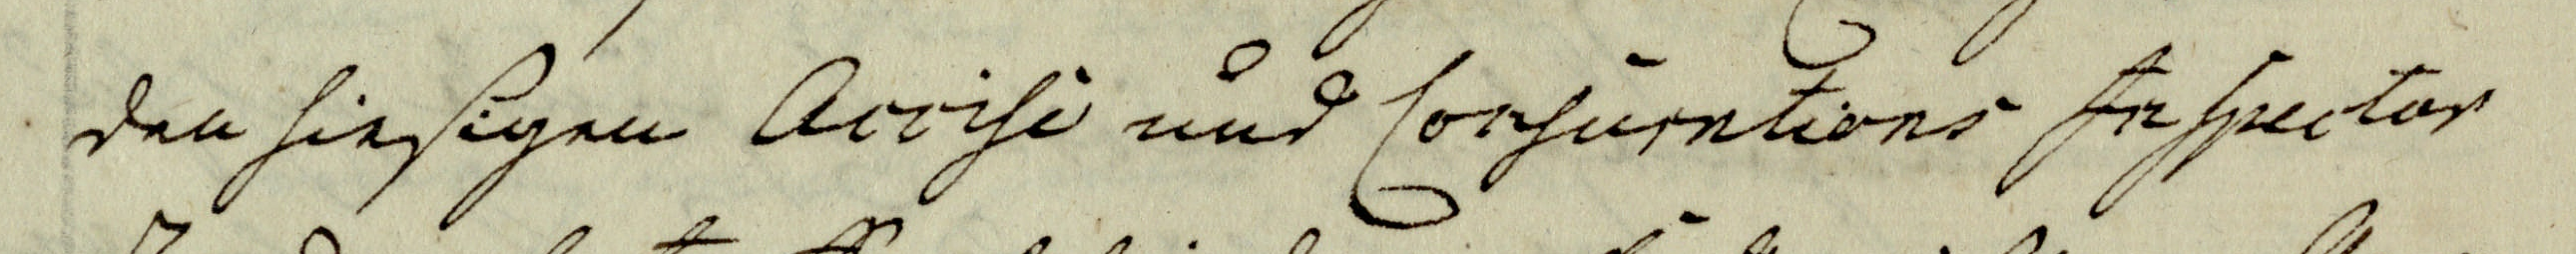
den hiesigen Accisi und Consumtions Inspector
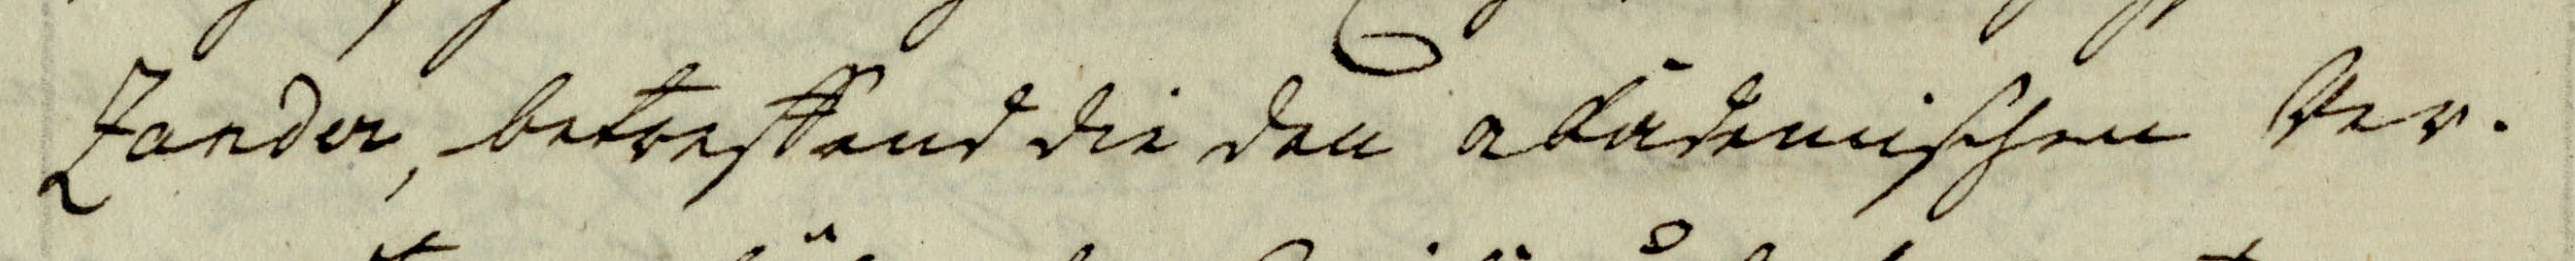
Zander, betreffend die den akademischen Ver¬
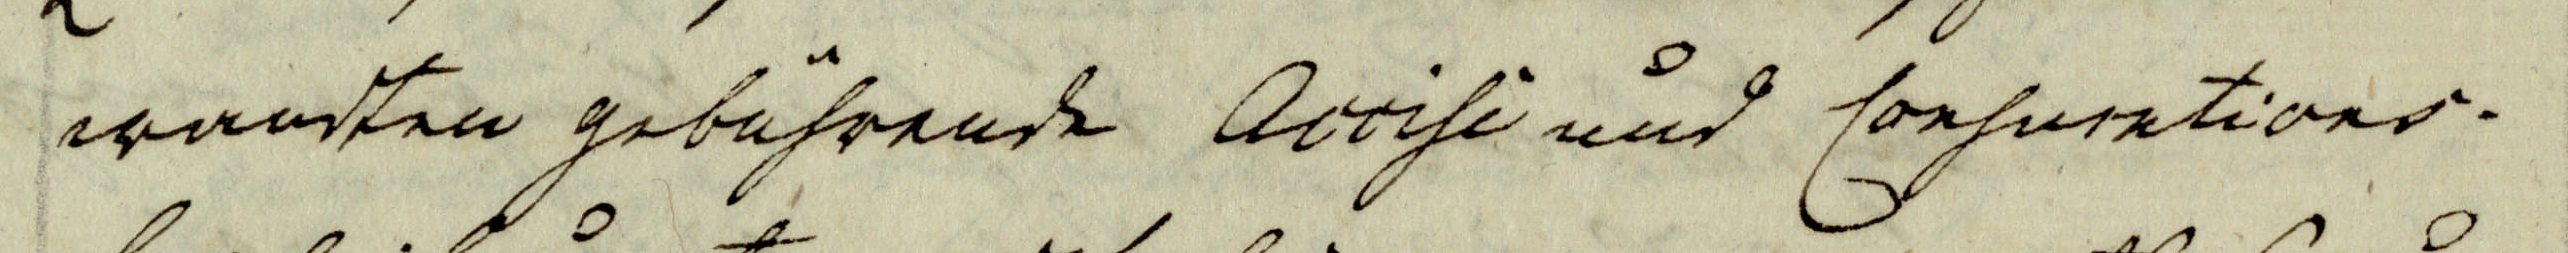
wandten gebührende Accisi und Consumtions¬
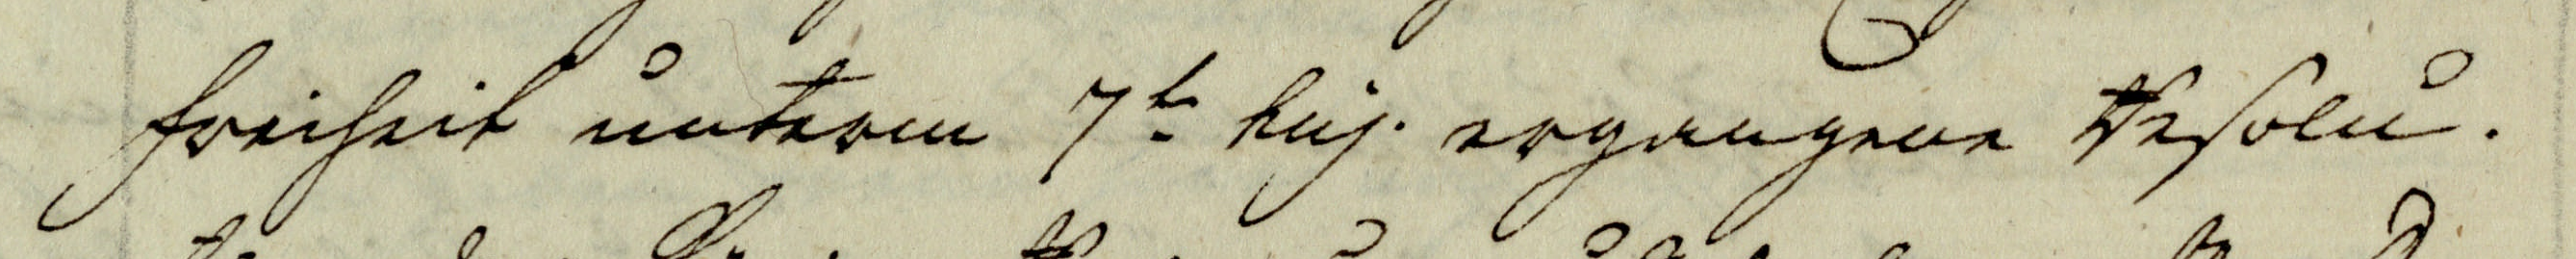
Freiheit unterm 7 ten huj. ergangene Resolu¬
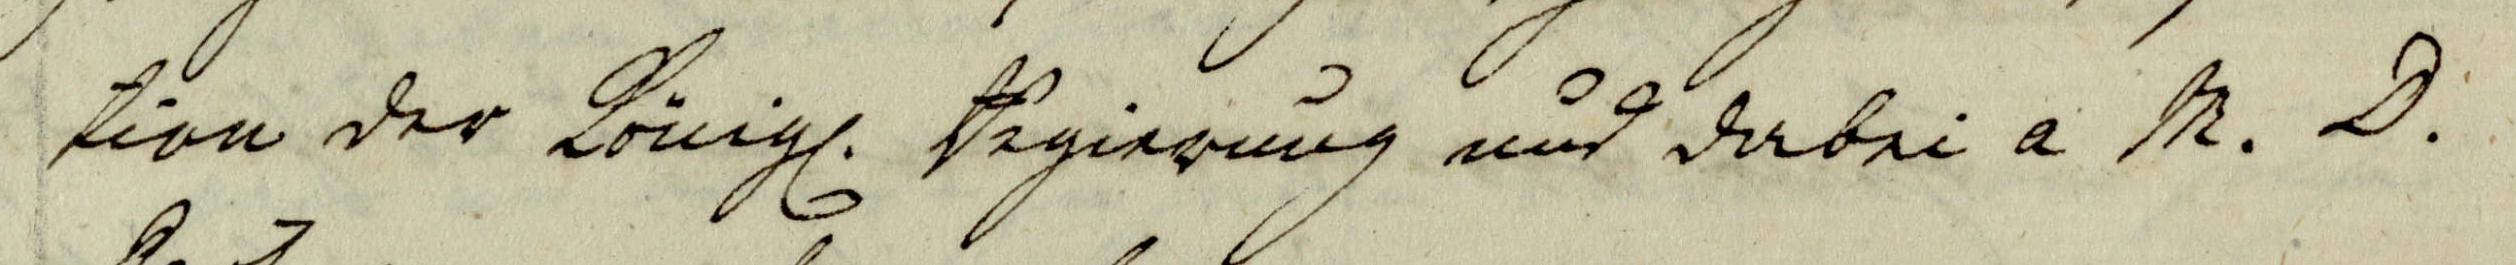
tion der Königl. Regierung und dabei a M. D.
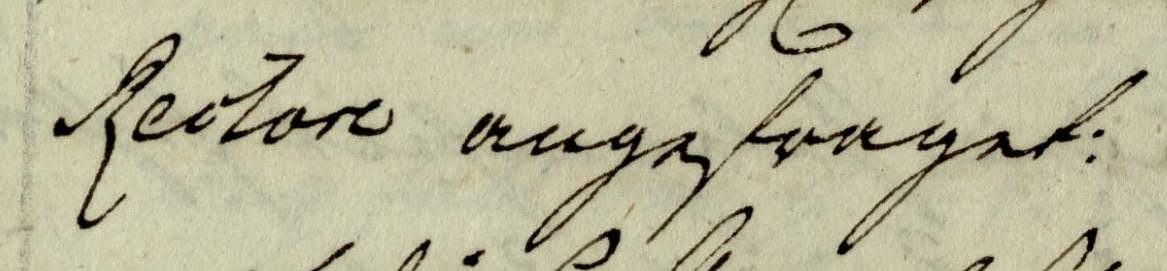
Rector angefraget:
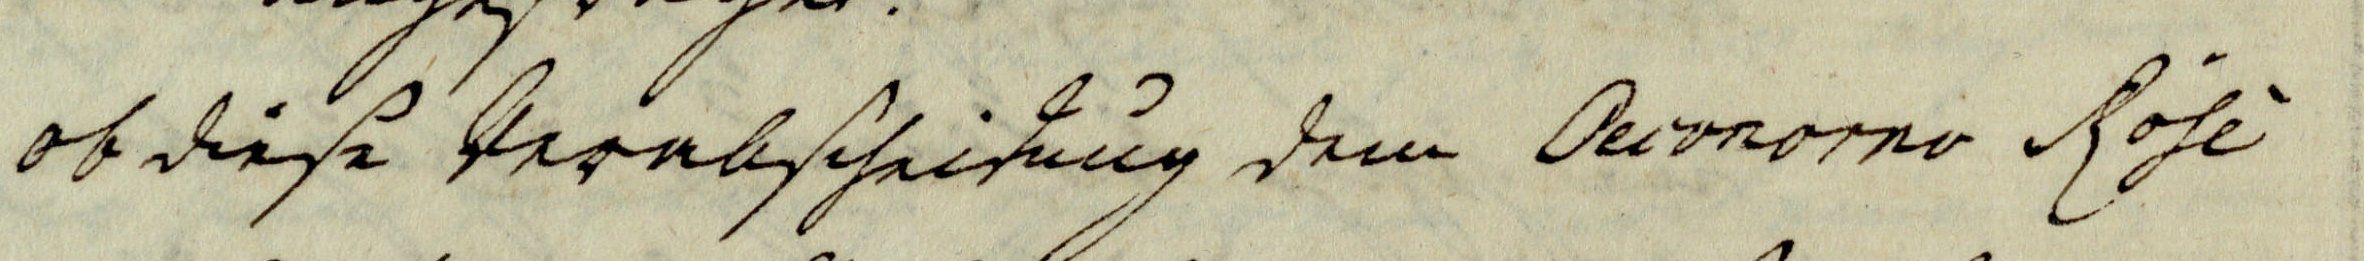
ob diese Verabscheidung dem Oeconomo Röse
